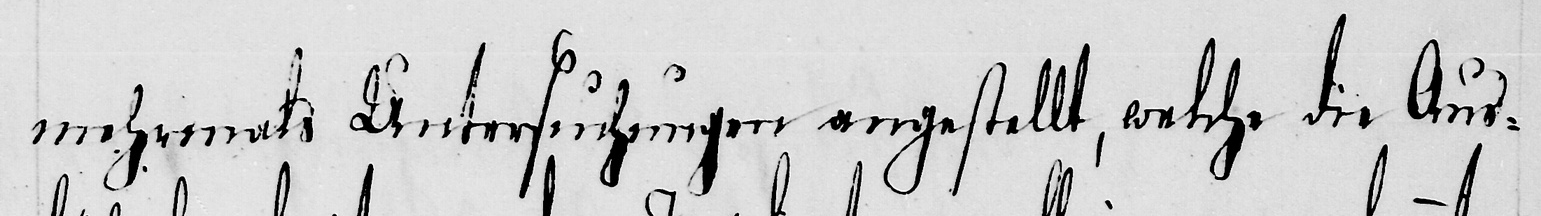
mehrmals Untersuchungen angestellt, welche die Aus¬
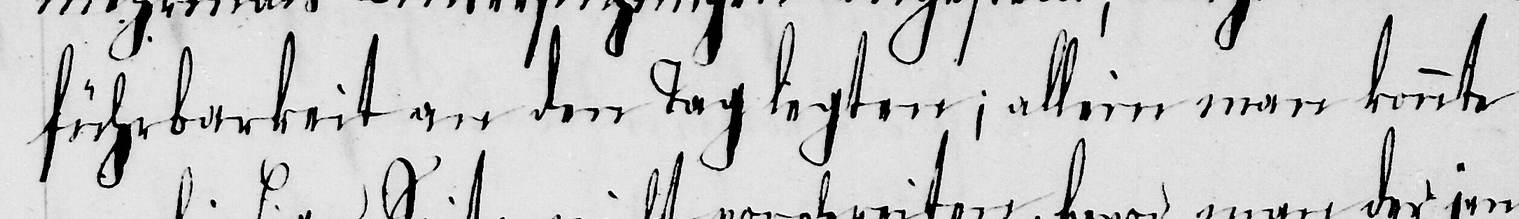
führbarkeit an den Tag legten; allein man konnte
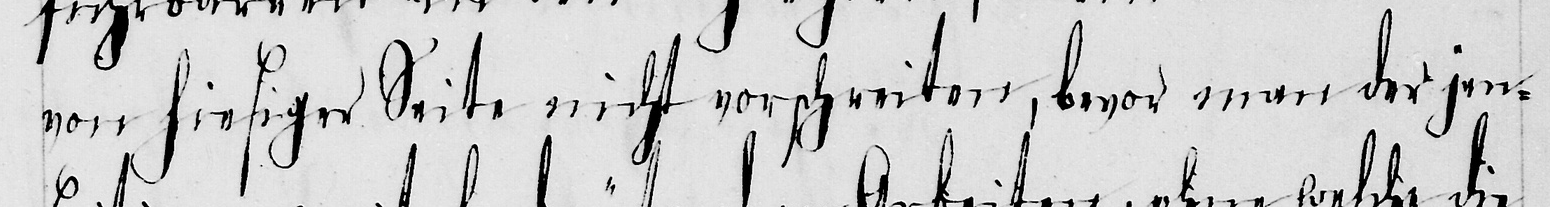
von hiesiger Seite nicht vorschreiten, bevor man der jen¬
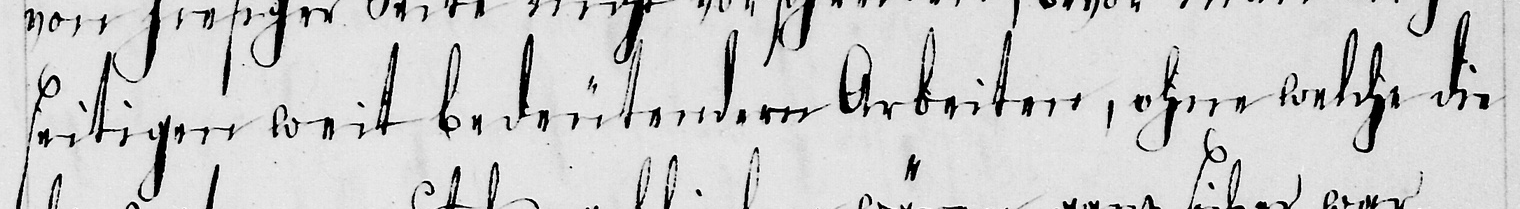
seitigen weit bedeutendern Arbeiten, ohne welche die
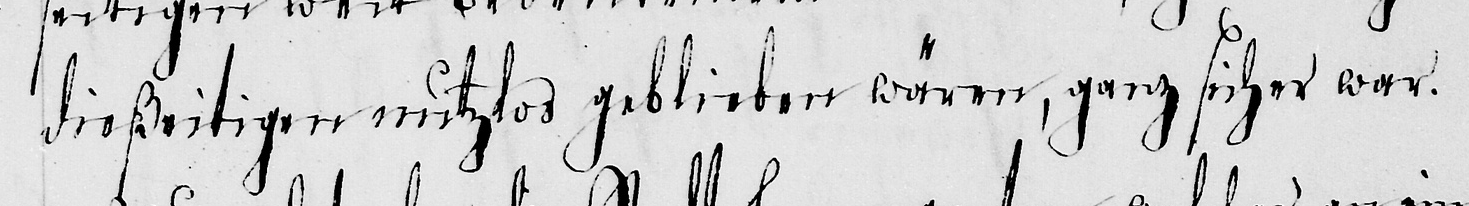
dießseitigen nutzlos geblieben wären, ganz sicher war.
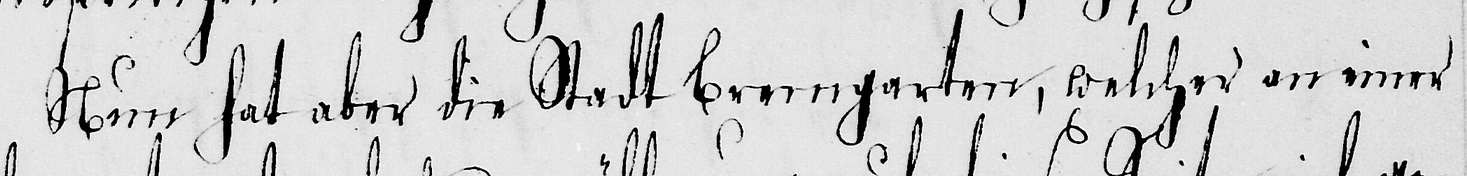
Nun hat aber die Stadt Bremgarten, welcher an einer
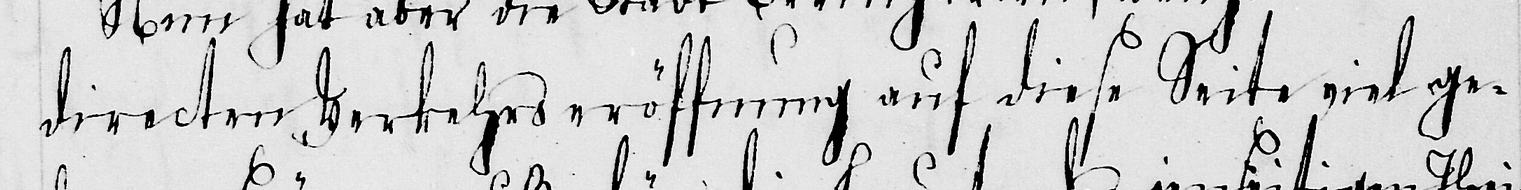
directen Verkehrseröffnung auf diese Seite viel ge¬
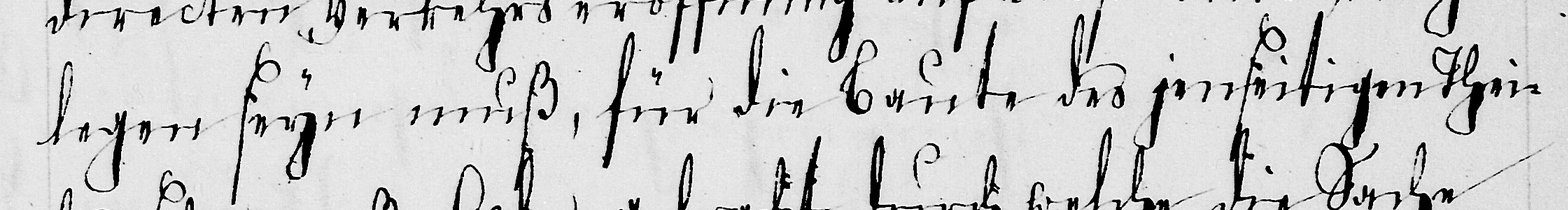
legen seyn muß, für die Baute des jenseitigen Thei¬
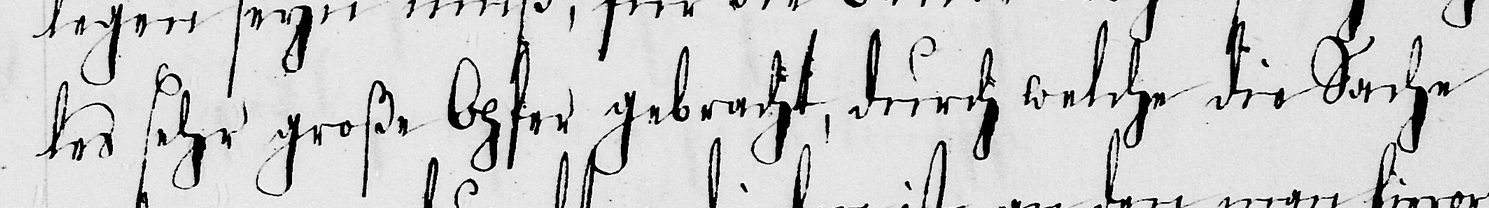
les sehr große Opfer gebracht, durch welche die Sache
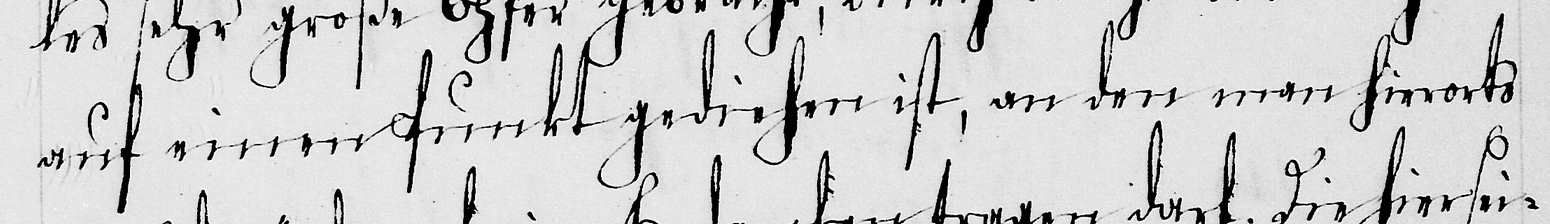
auf einen Punkt gediehen ist, an den man hierorts
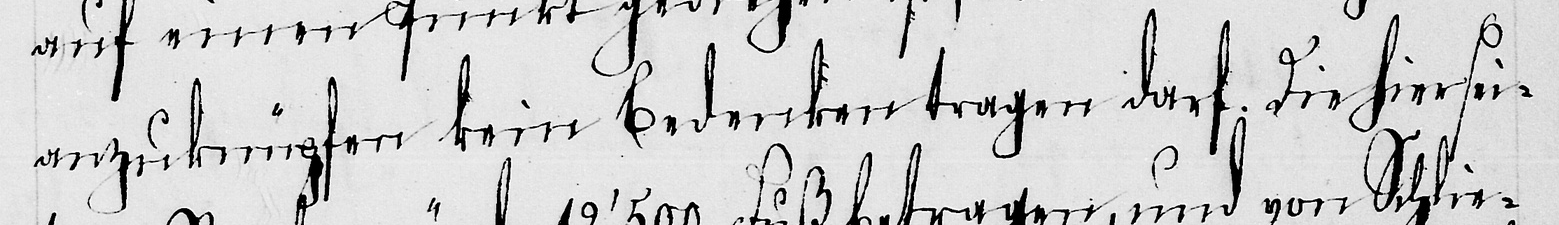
anzuknüpfen kein Bedenken tragen darf. Die hiersei¬
